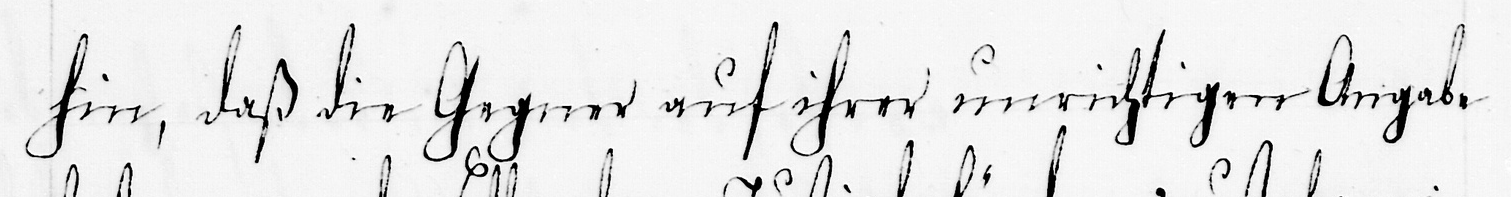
hin, daß die Gegner auf ihrer unrichtigen Angabe
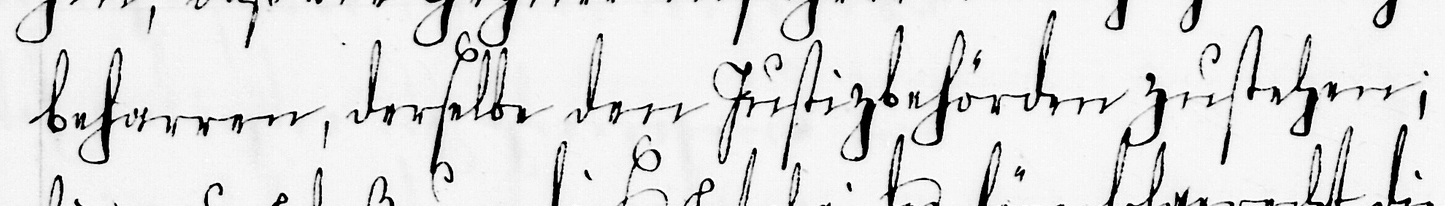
beharren, derselbe den Justizbehörden zustehen;
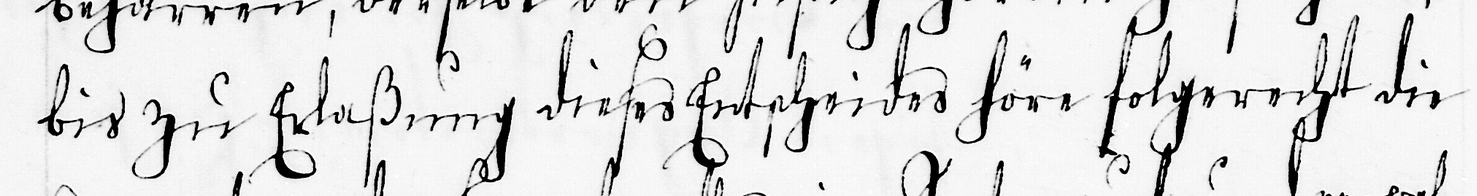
bis zu Erlaßung dieses Entscheides höre folgerecht die
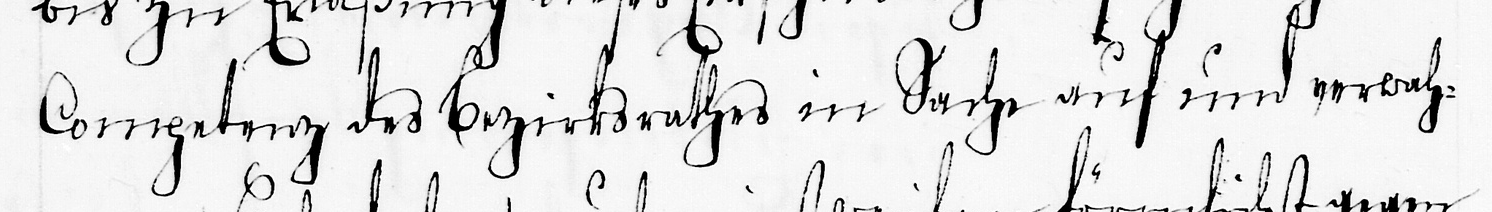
Competenz des Bezirksrathes in Sache auf und verwah¬
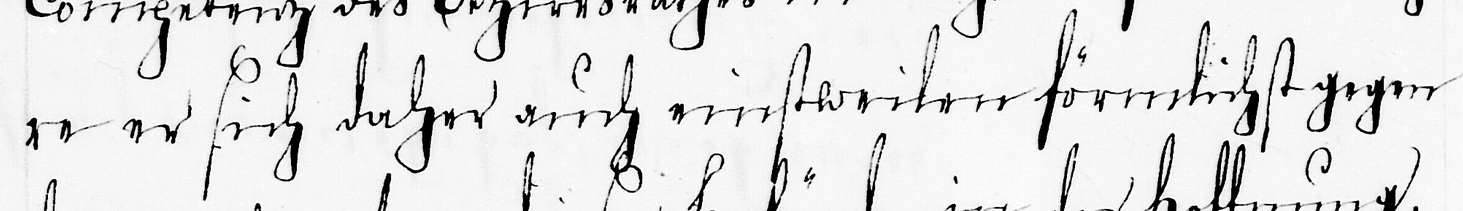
re er sich daher auch einstweilen förmlichst gegen
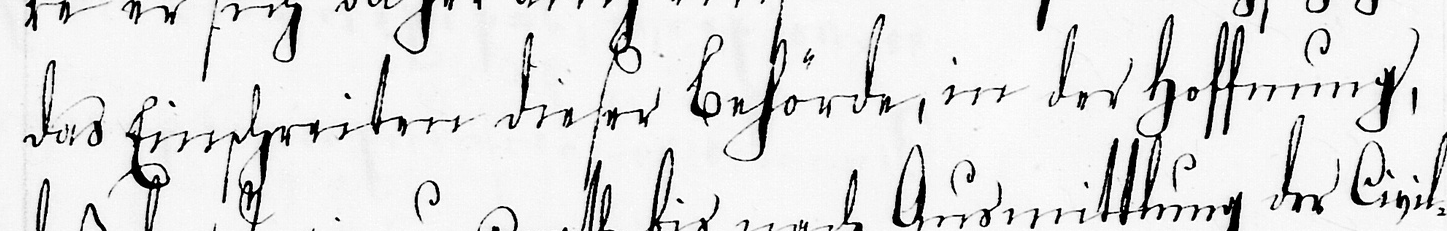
das Einschreiten dieser Behörde, in der Hoffnung,
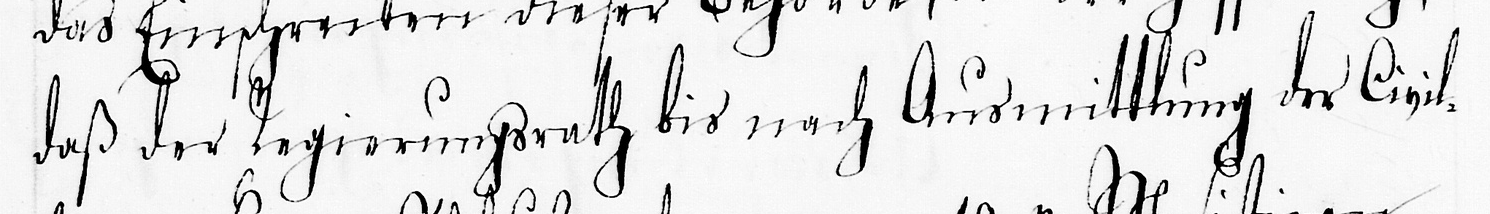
daß der Regierungsrath bis nach Ausmittlung der Civil¬
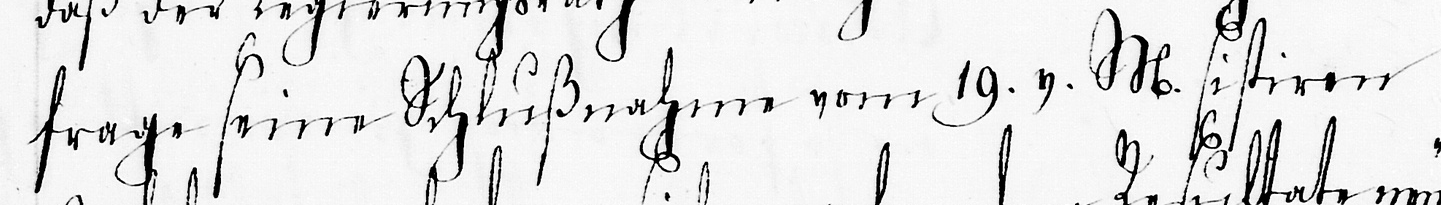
frage seine Schlußnahme vom 19. v. M. sistiren
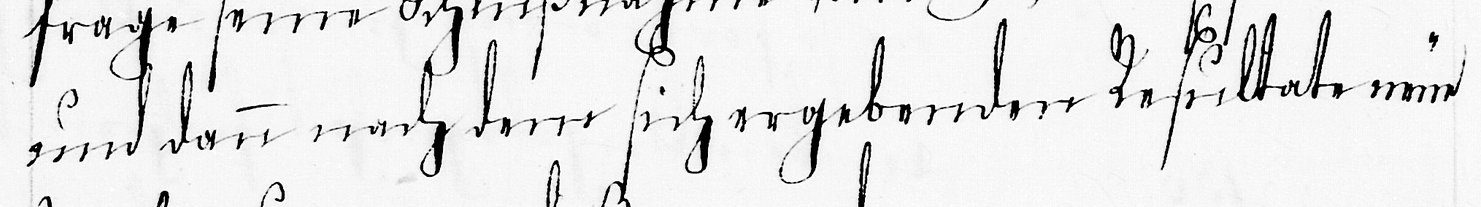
und dann nach dem sich ergebenden Resultate neue
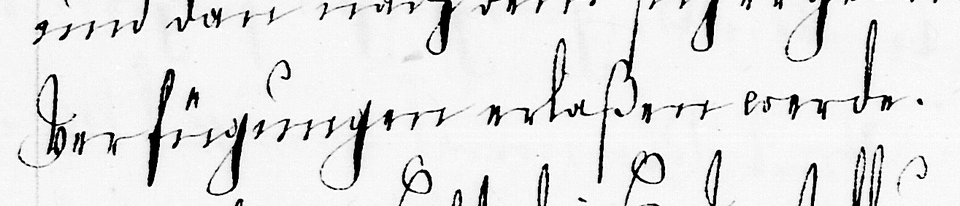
Verfügungen erlaßen werde.
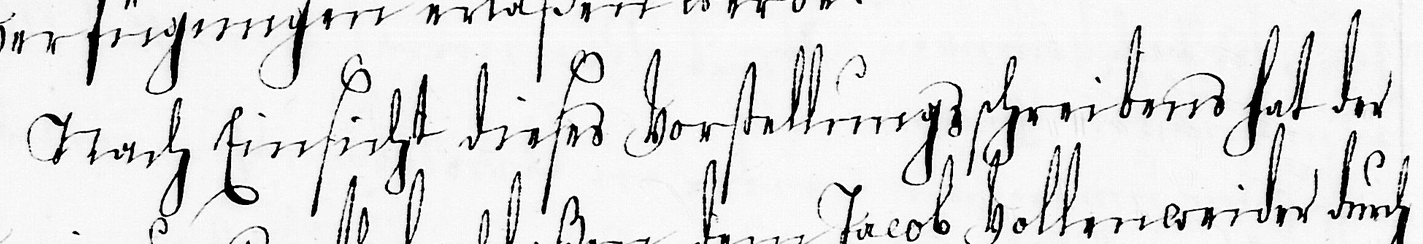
Nach Einsicht diese Vorstellungsschreibens hat der
